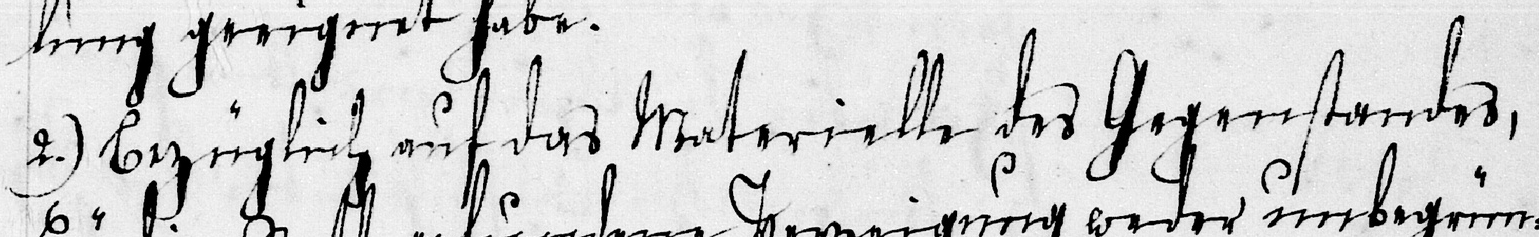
2.) Bezüglich auf das Materielle des Gegenstandes,
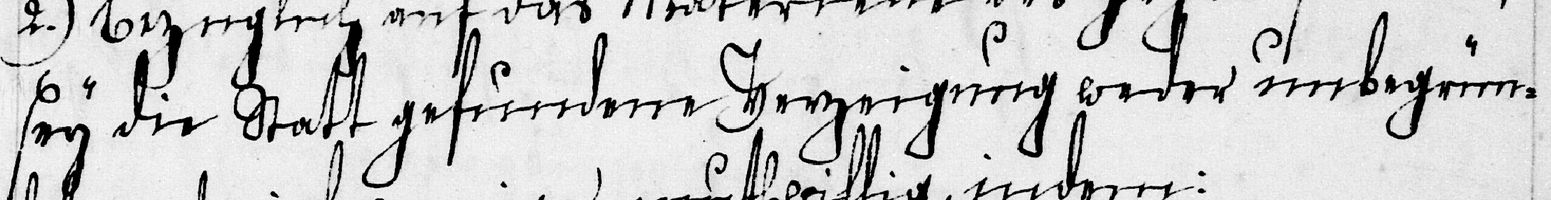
sey die Statt gefundene Verzeigung weder unbegrün¬
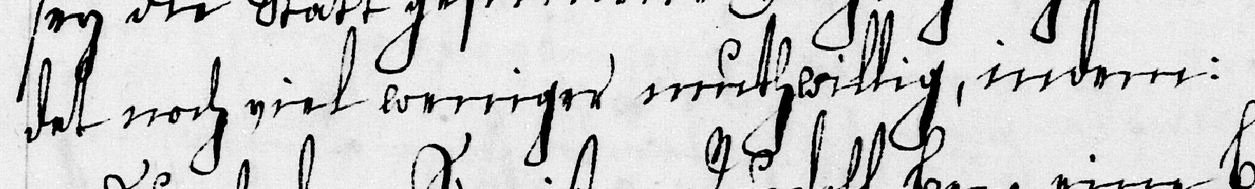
det noch viel weniger muthwillig, indem:
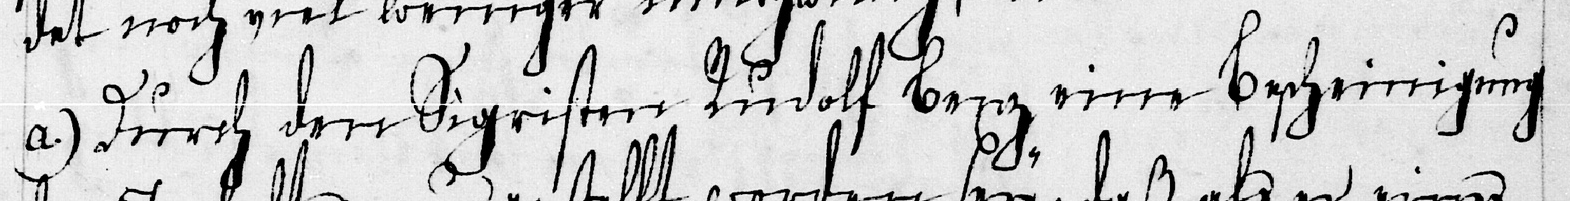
a.) Durch den Sigristen Rudolf Benz eine Bescheinigung
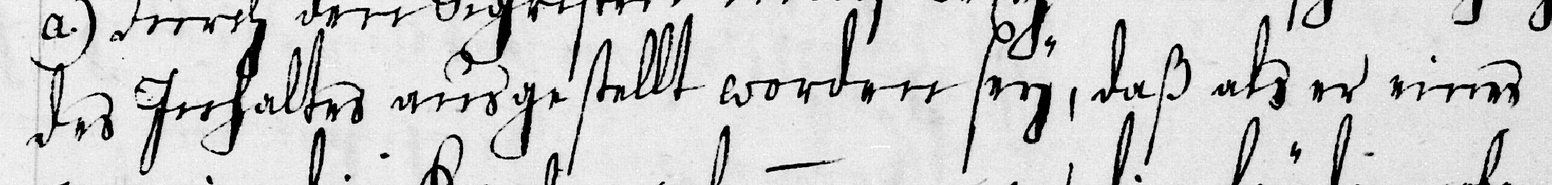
des Inhaltes ausgestellt worden sey, daß als er eines
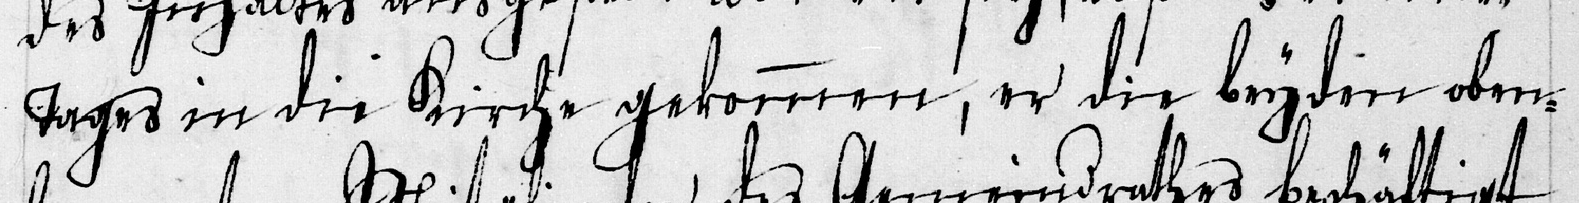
Tages in die Kirche gekommen, er die beyden oben¬
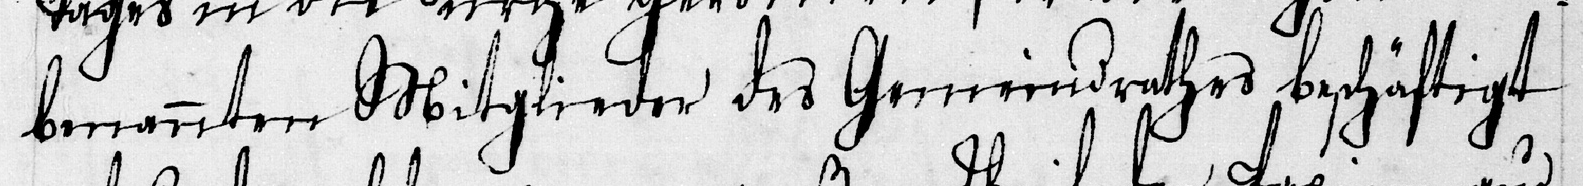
benannten Mitglieder des Gemeindrathes beschäftigt
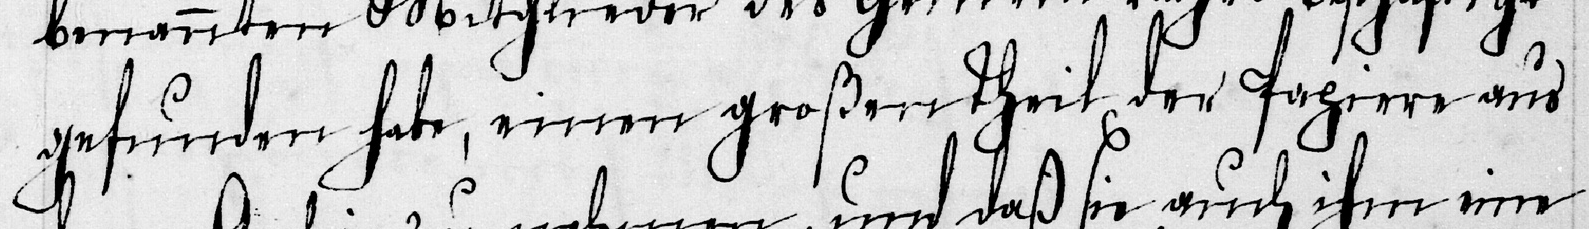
gefunden habe, einen großen Theil der Papiere aus
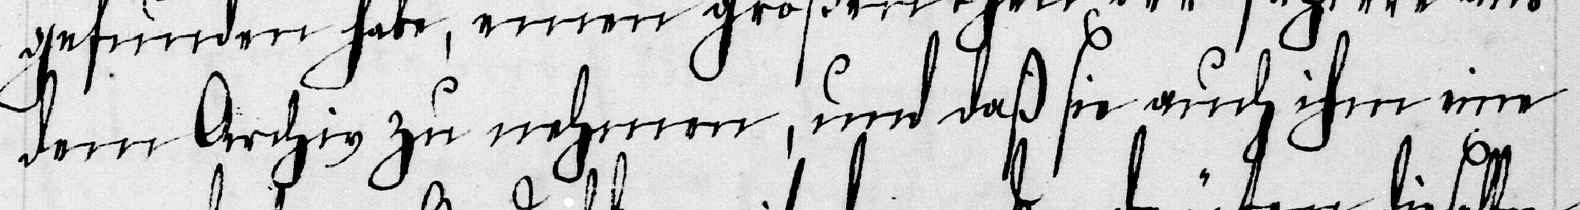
dem Archiv zu nehmen, und daß sie auch ihm eine
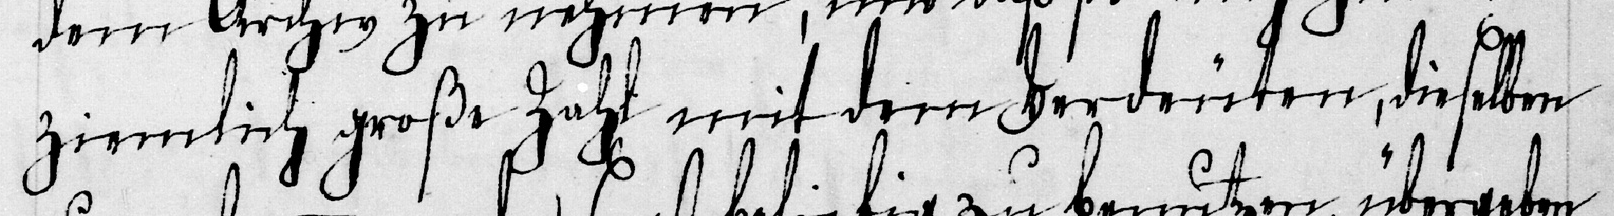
ziemlich große Zahl mit dem Verdeuten, dieselben
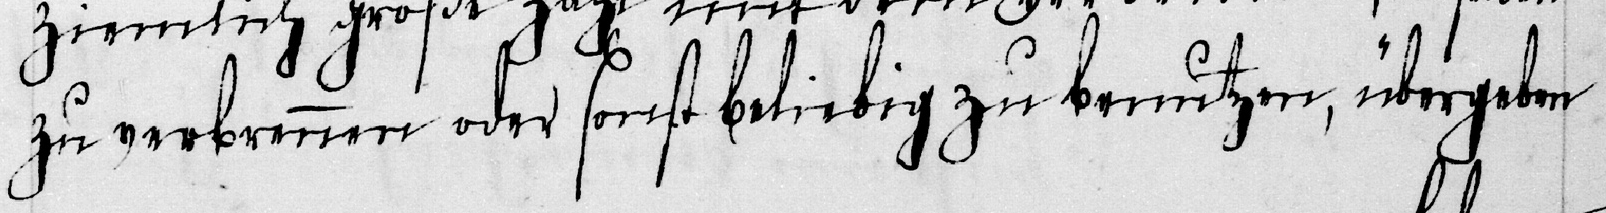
zu verbrennen oder sonst beliebig zu benutzen, übergeben
